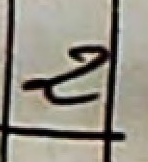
2
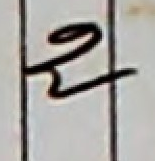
2
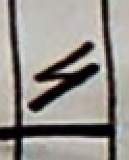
4
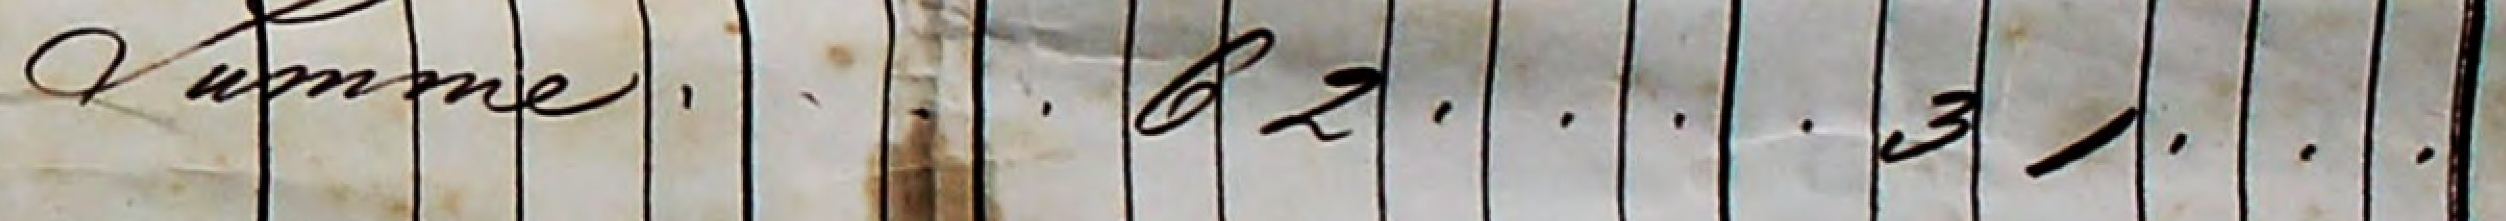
Summe .... 62 .... 31 ...
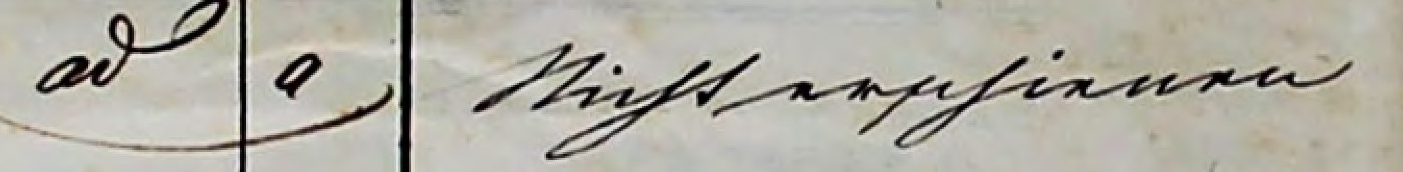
ad a Nicht erschienen
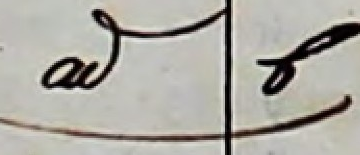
ad b
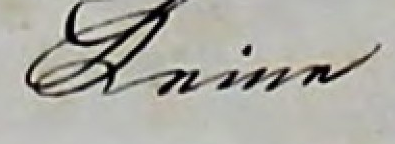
Keine
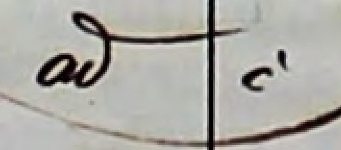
ad c
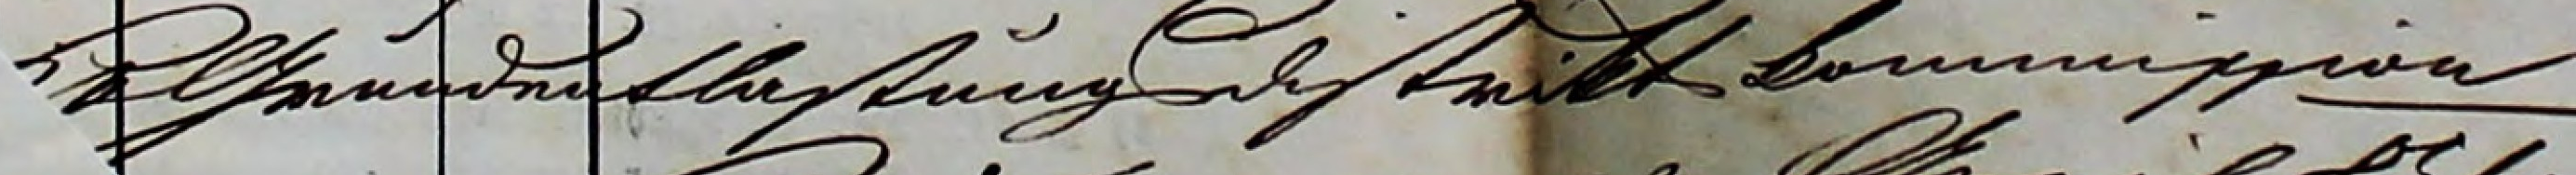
kk Grundentlastung Distrikt Kommission
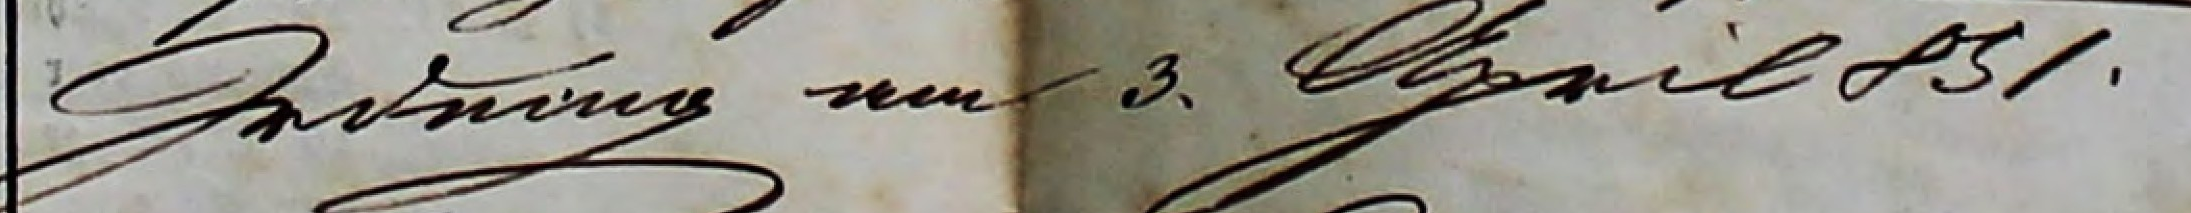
Jrdning am 3. April 851.
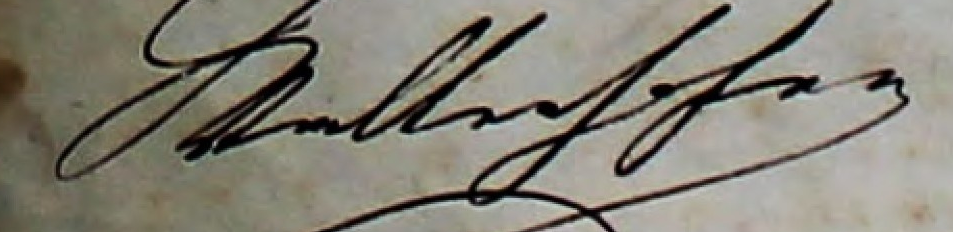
Walterscher
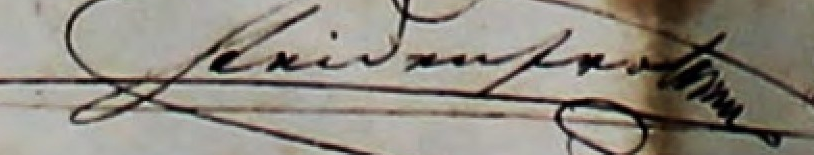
Steidens???
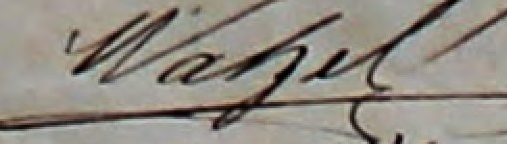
Walzel.
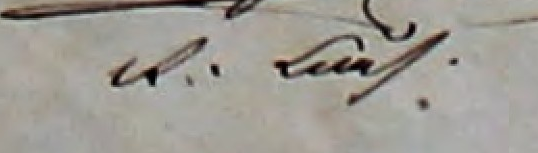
??. Caus.
